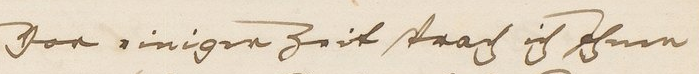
Vor einiger Zeit sprach ich Ihnen
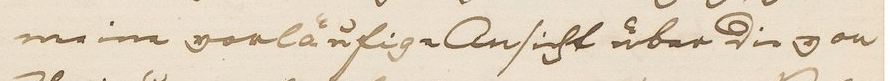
meine vorläufige Ansicht über die von
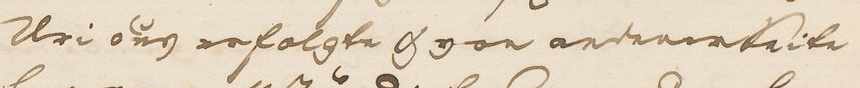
Uri aus erfolgte & von anderer Seite
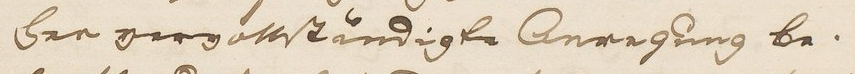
her vervollständigte Anregung be-
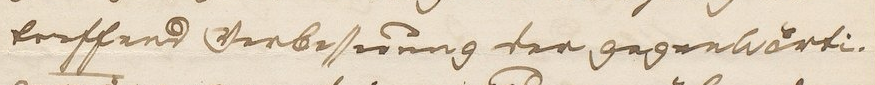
treffend Verbesserung der gegenwärti-
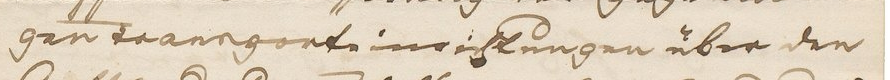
gen Transporteinrichtungen über den
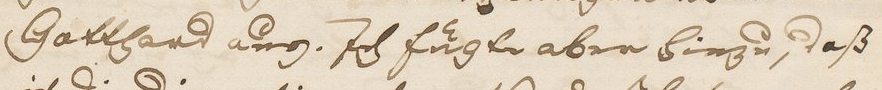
Gotthard aus. Ich fügte aber hinzu, daß
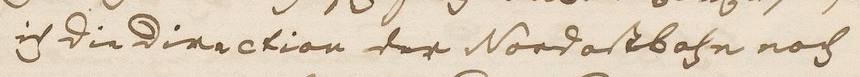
ich die Direction der Nordostbahn noch
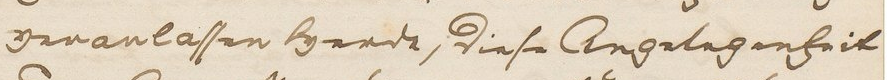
veranlassen werde, diese Angelegenheit
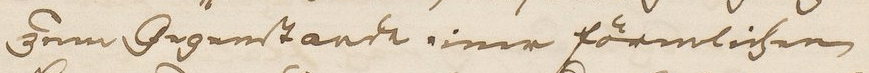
zum Gegenstande einer förmlichen
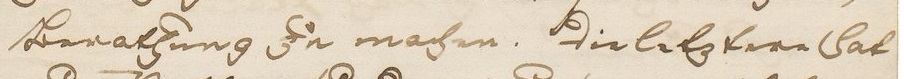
Berathung zu machen. Die letztere hat
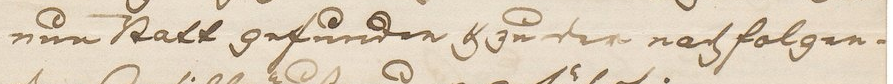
nun Statt gefunden & zu der nachfolgen-
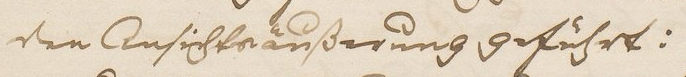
den Ansichtsäußerung geführt:
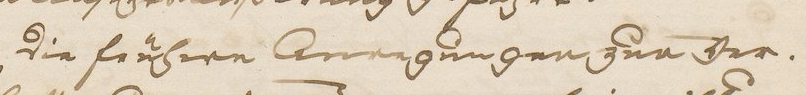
«Die frühern Anregungen zur Ver-
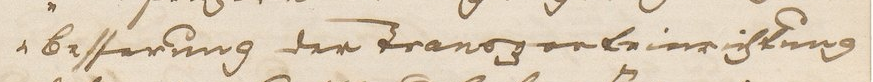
besserung der Transporteinrichtung
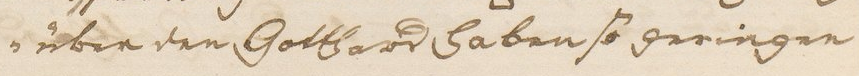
über den Gotthard haben so geringen
